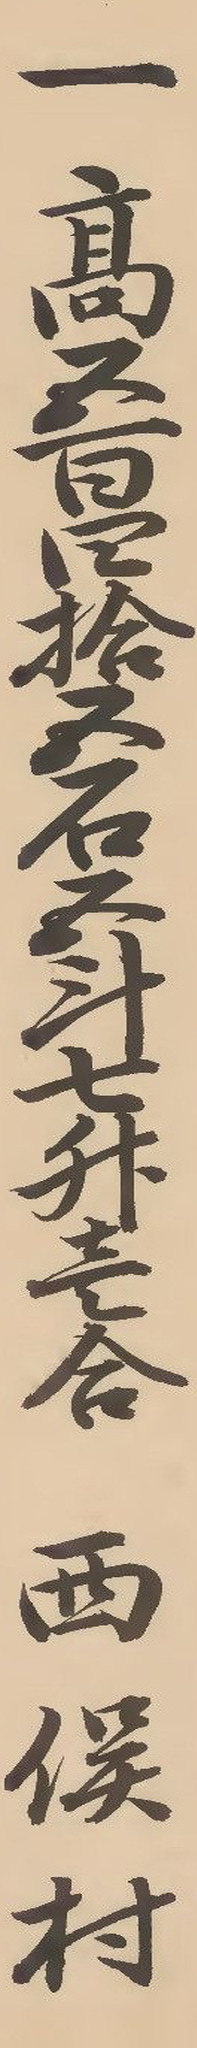一高五百四拾五石五斗七升壱合西俣村
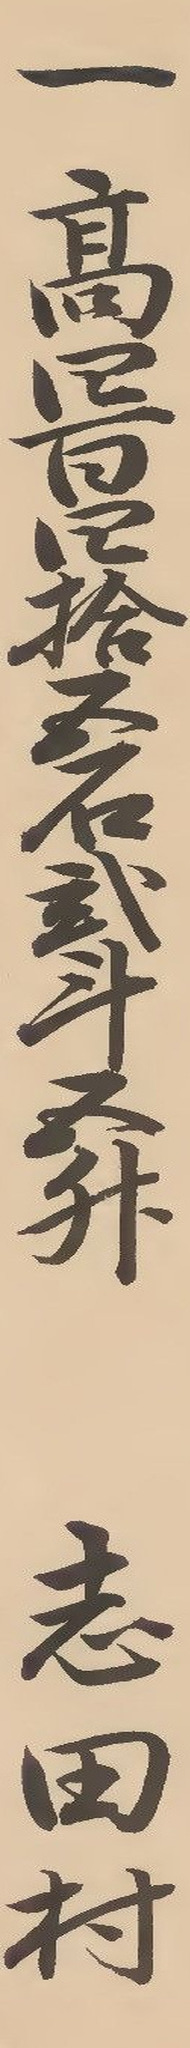一高四百四拾五石弐斗五升志田村
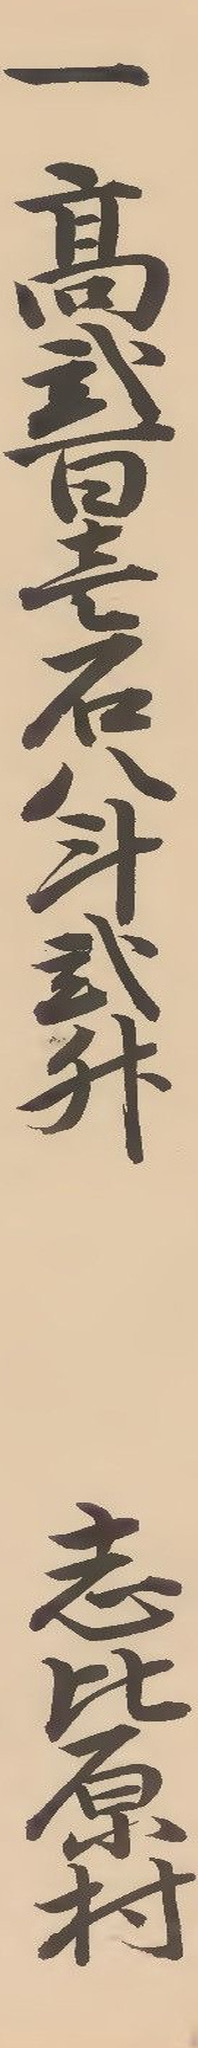一高弐百壱石八斗弐升志比原村
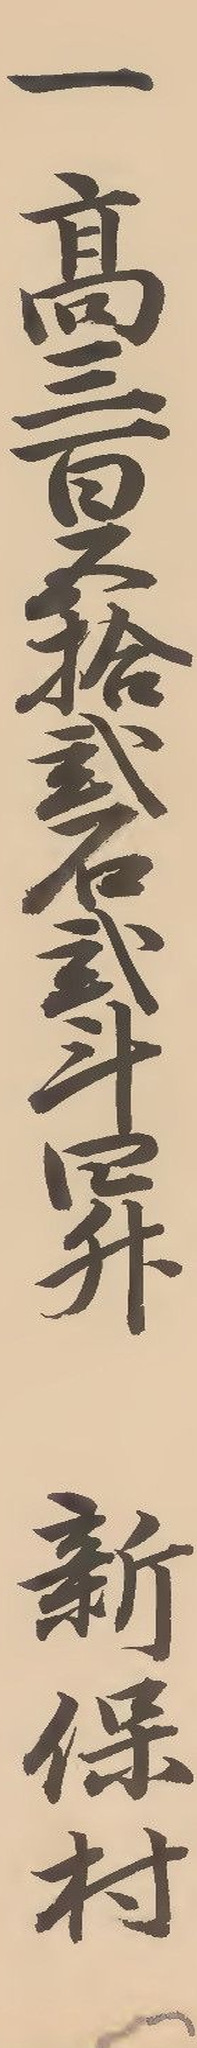一高三百五拾弐石弐斗四升新保村

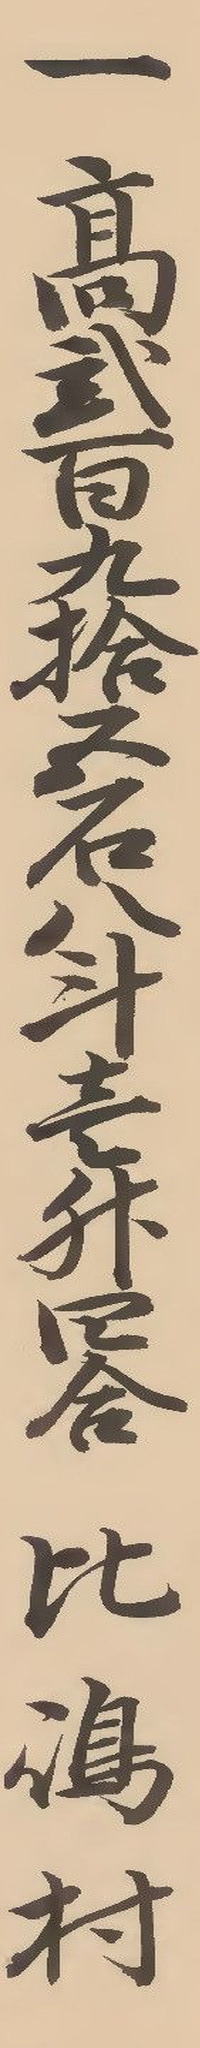一高弐百九拾五石八斗壱升四合比島村
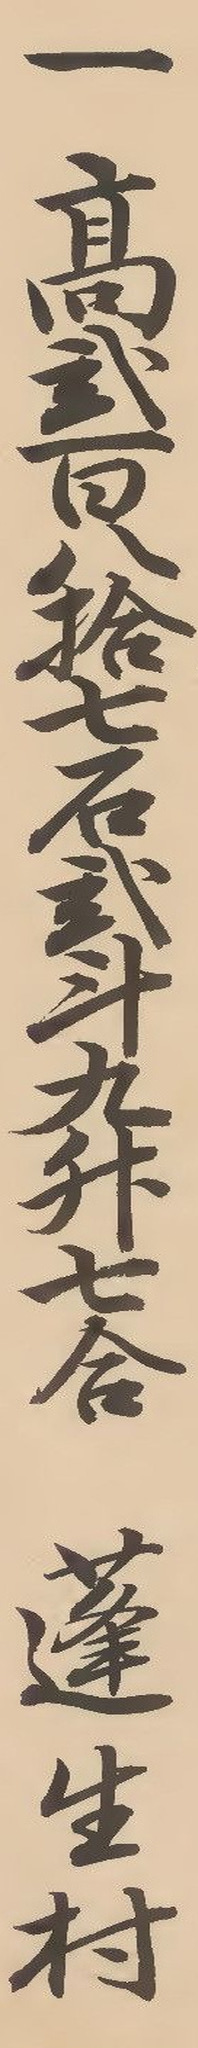一高弐百八拾七石弐斗九升七合蓬生村
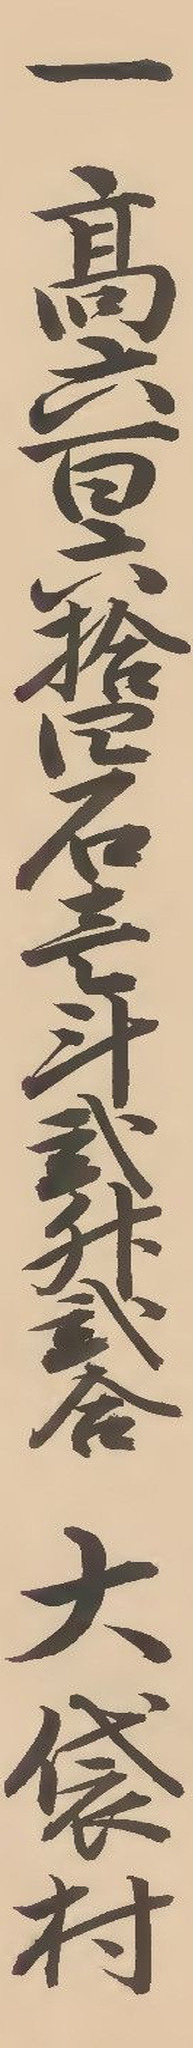一高六百六拾四石壱斗弐升弐合大袋村
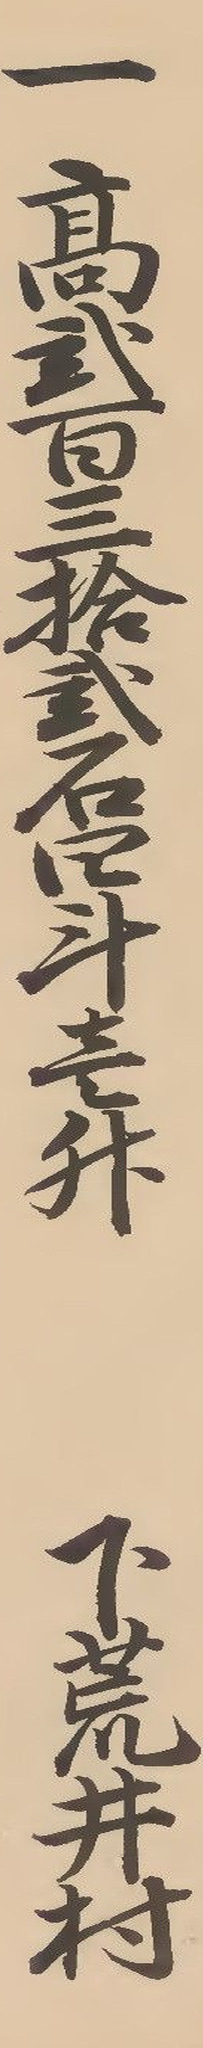一高弐百三拾弐石四斗壱升下荒井村
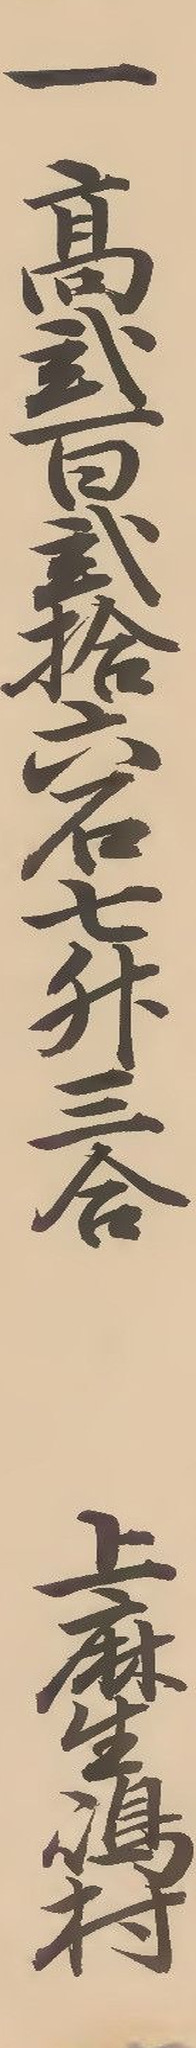一高弐百弐拾六石七升三合上麻生島村
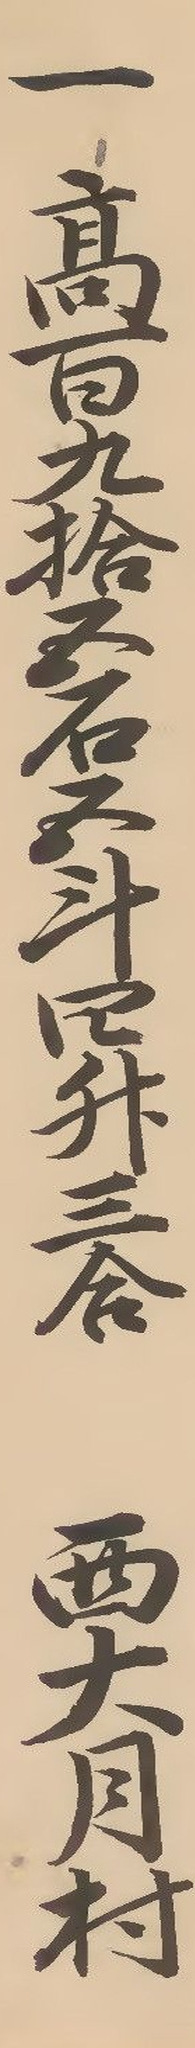一高百九拾五石五斗四升三合西大月村

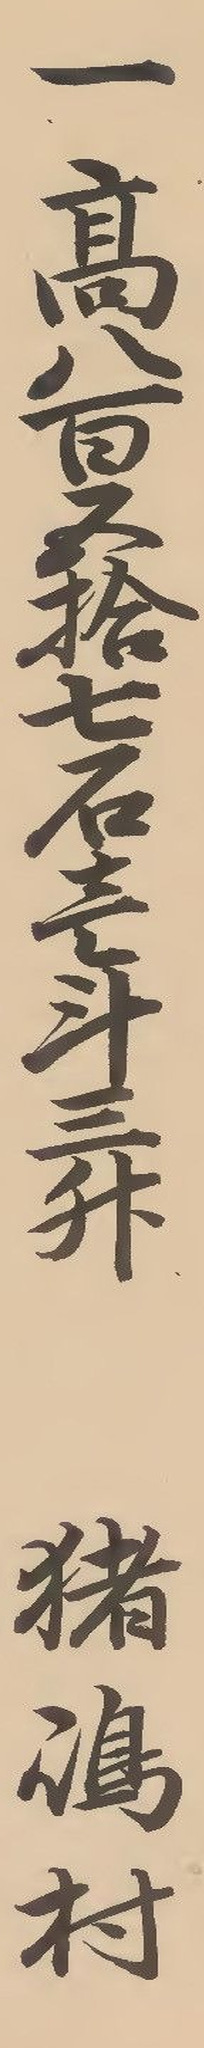一高八百五拾七石壱斗三升猪島村
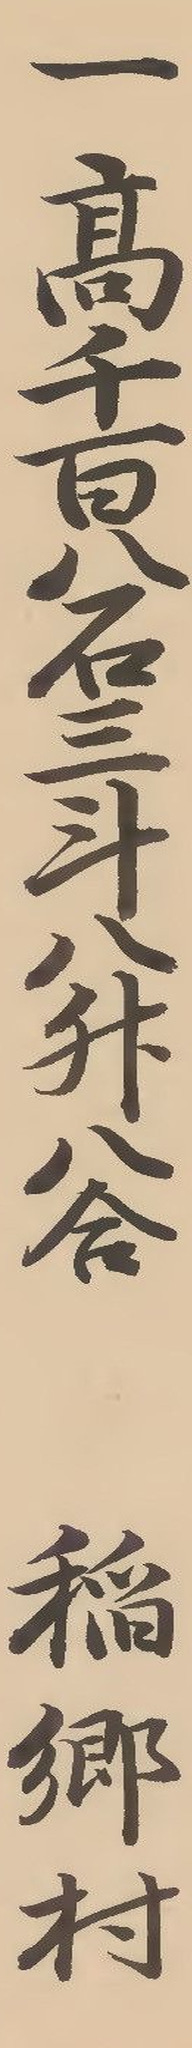一高千百八石三斗八升八合稲郷村
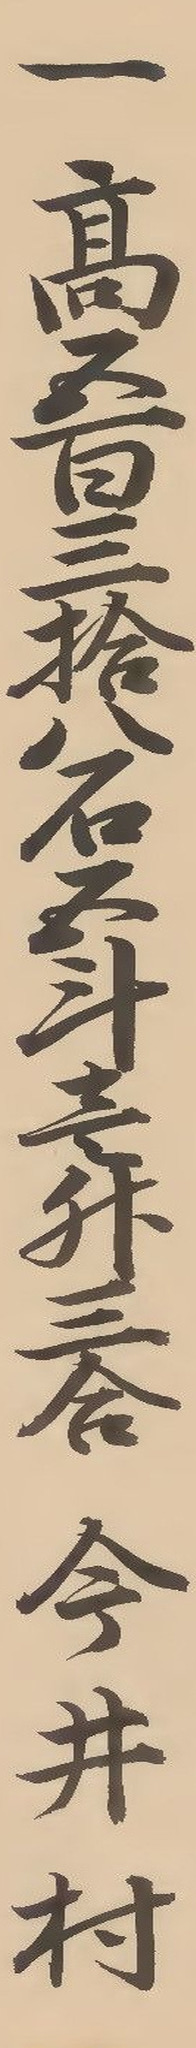一高五百三拾八石五斗壱升三合今井村
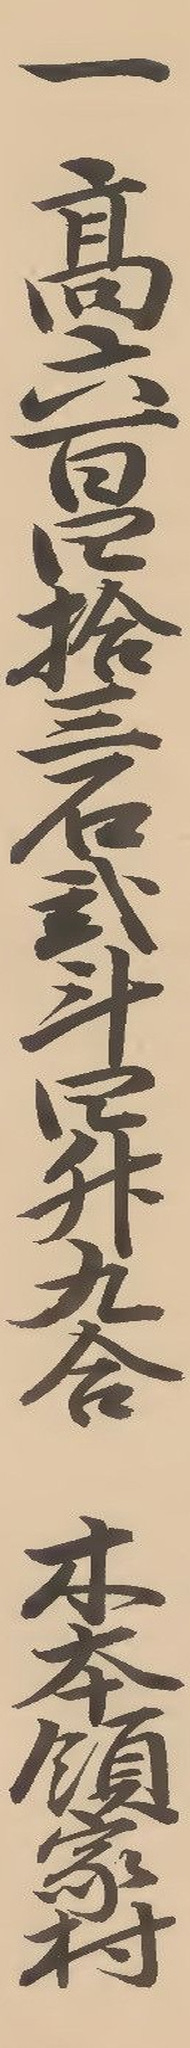一高六百四拾三石弐斗四升九合木本領家村
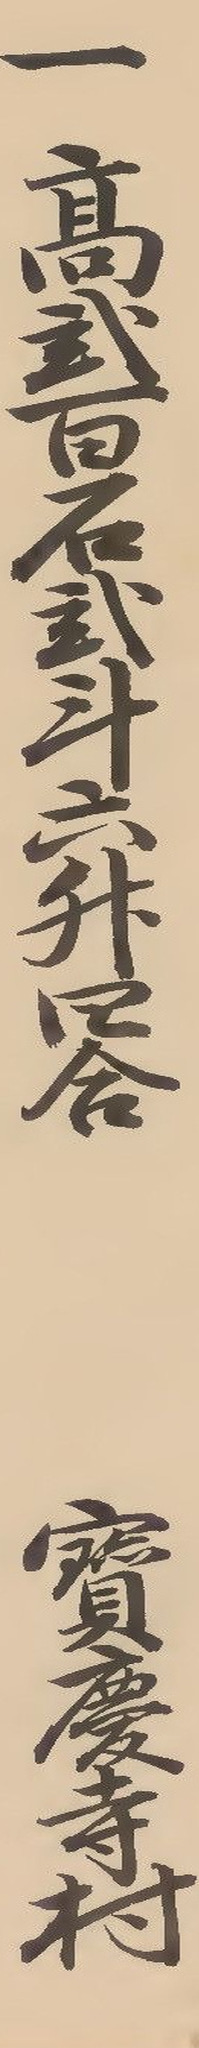一高弐百石弐斗六升四合宝慶寺村
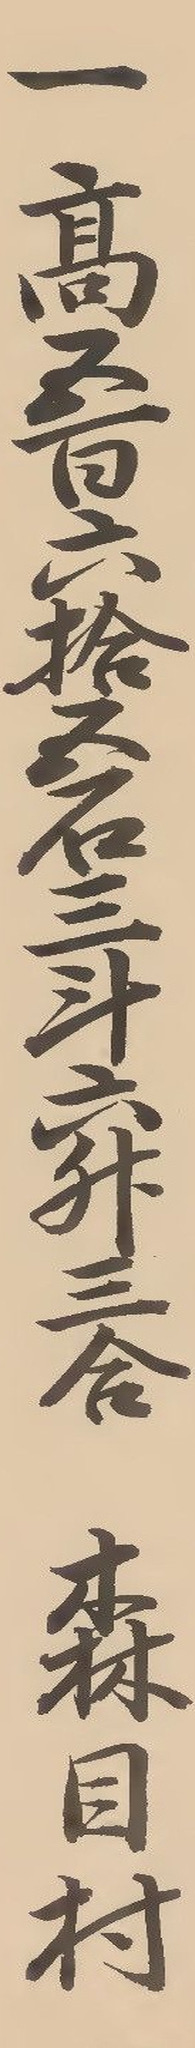一高五百六拾五石三斗六升三合森目村
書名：越前国郷帳
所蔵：国立公文書館 National Archives of Japan
